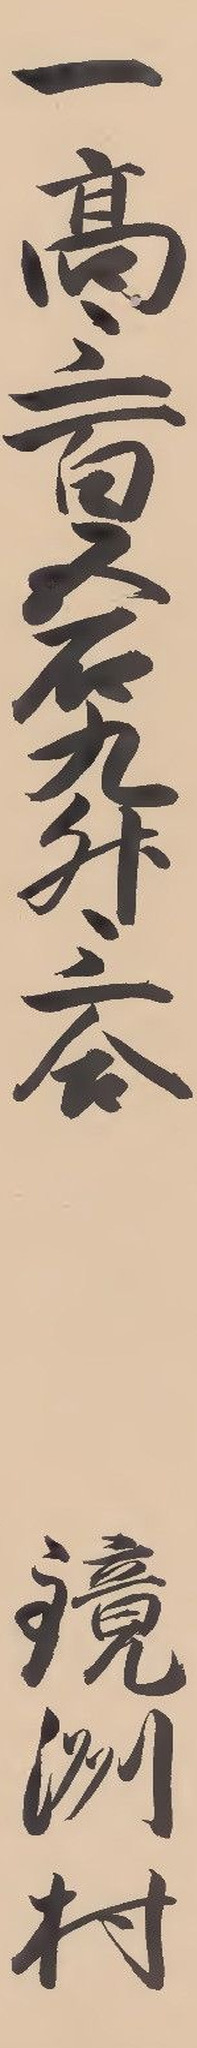一高三百五石九升三合鏡洲村
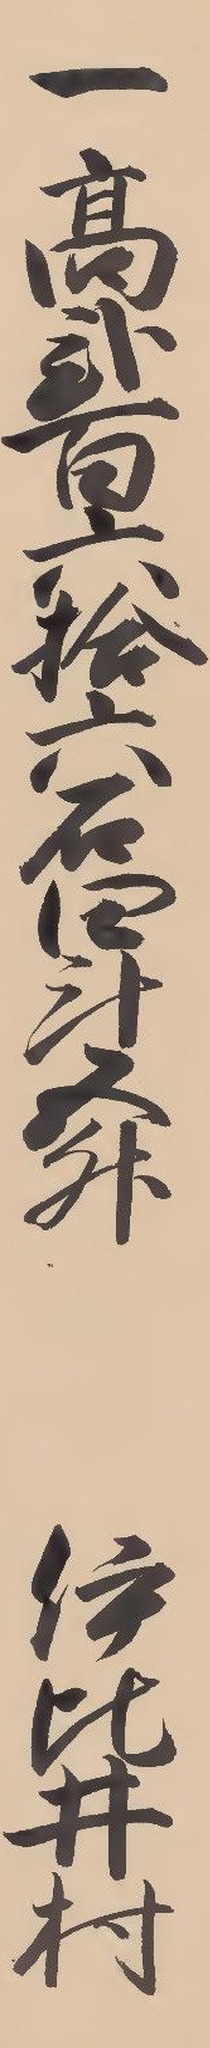一高弐百六拾六石四斗五升伊比井村
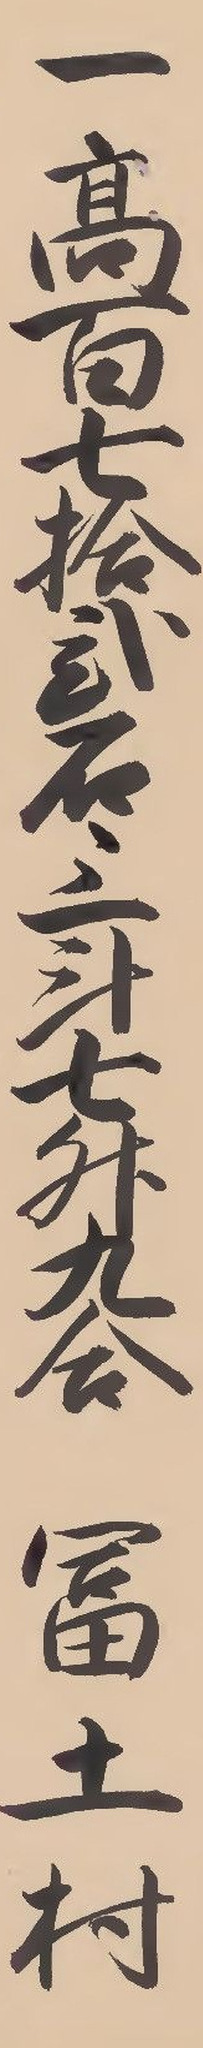一高百七拾弐石三斗七升九合富土村
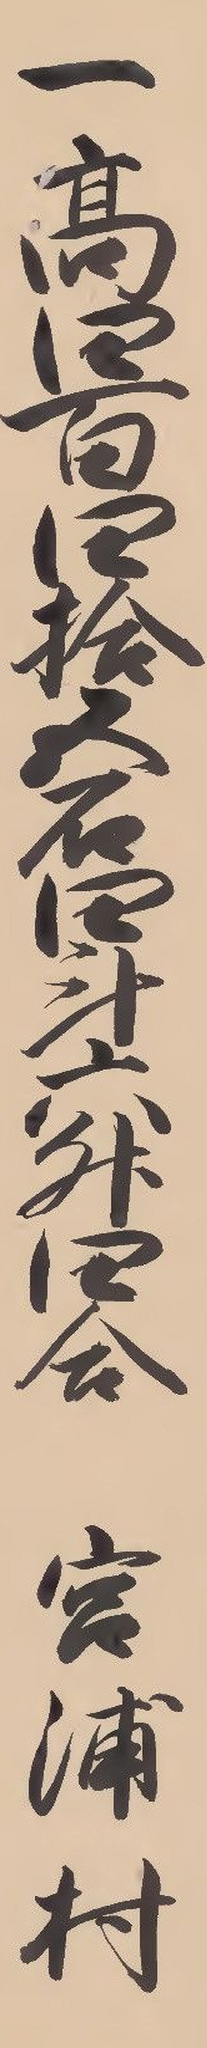一高四百四拾五石四斗六升四合宮浦村
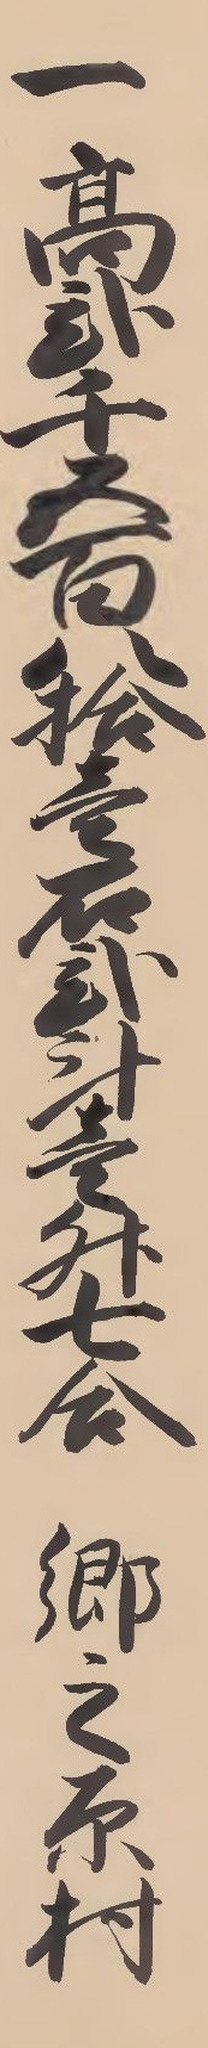一高弐千五百八拾壱石弐斗壱升七合郷之原村
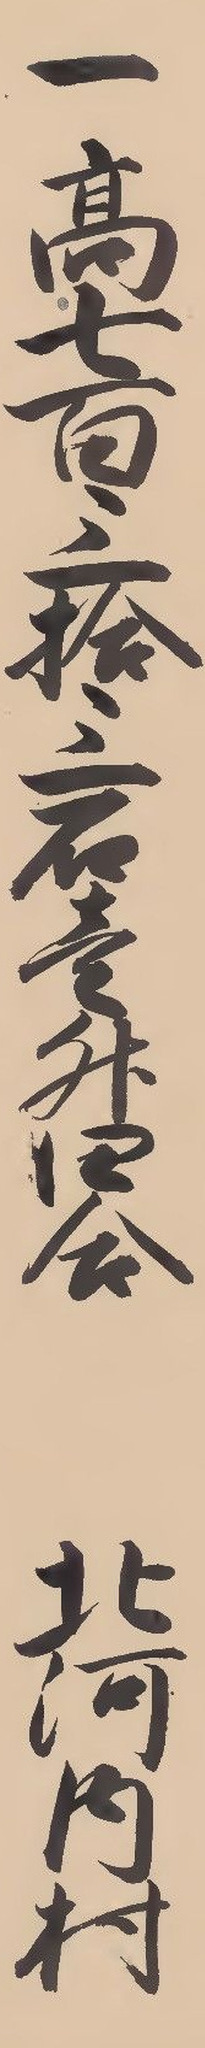一高七百三拾三石壱升四合北河内村
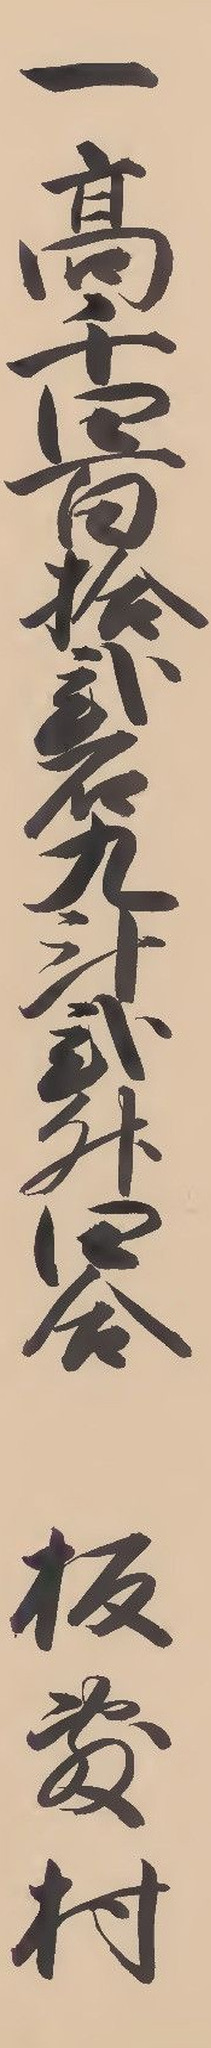一高千四百拾弐石九斗弐升四合板敷村

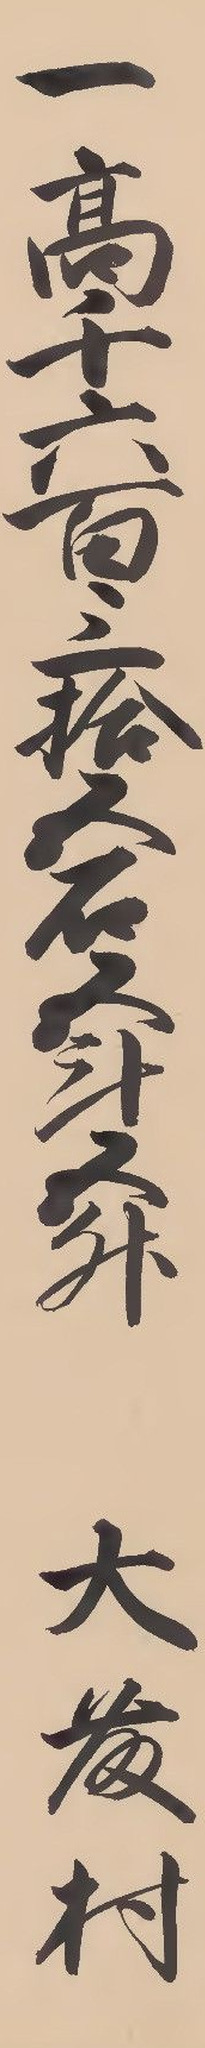一高千六百三拾五石五斗五升大藤村
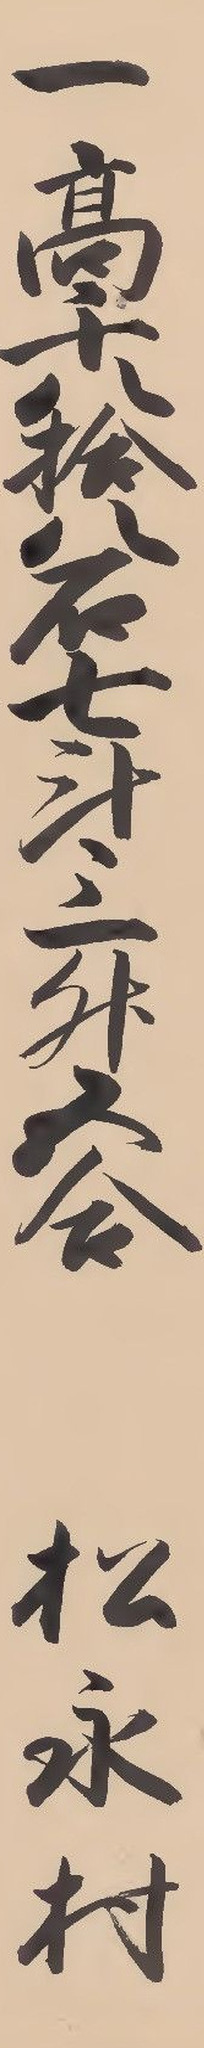一高千八拾八石七斗三升五合松永村
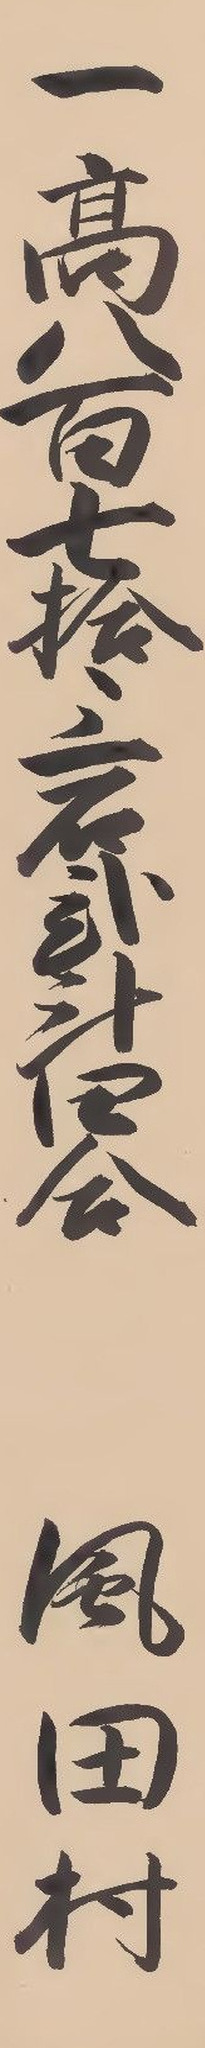一高八百七拾三石弐斗四合風田村
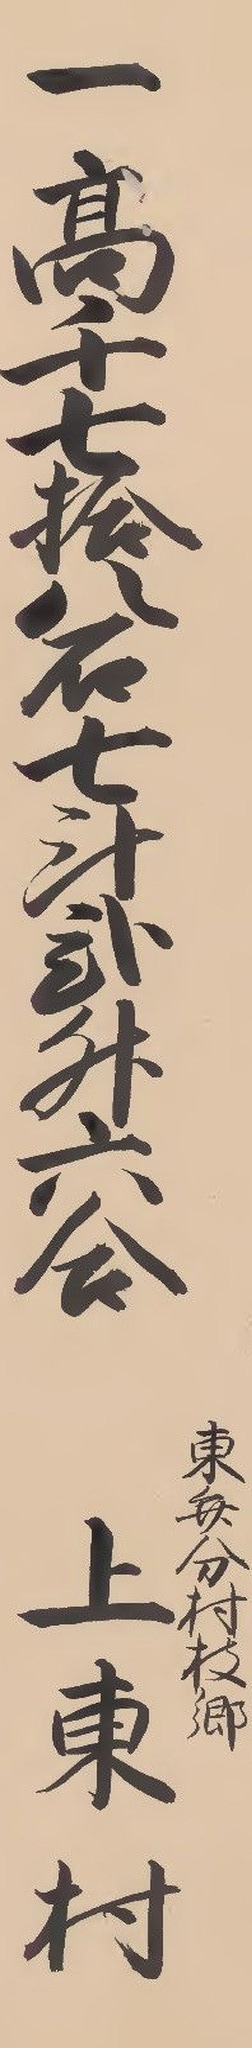一高千八拾八石七斗三升五合松永村
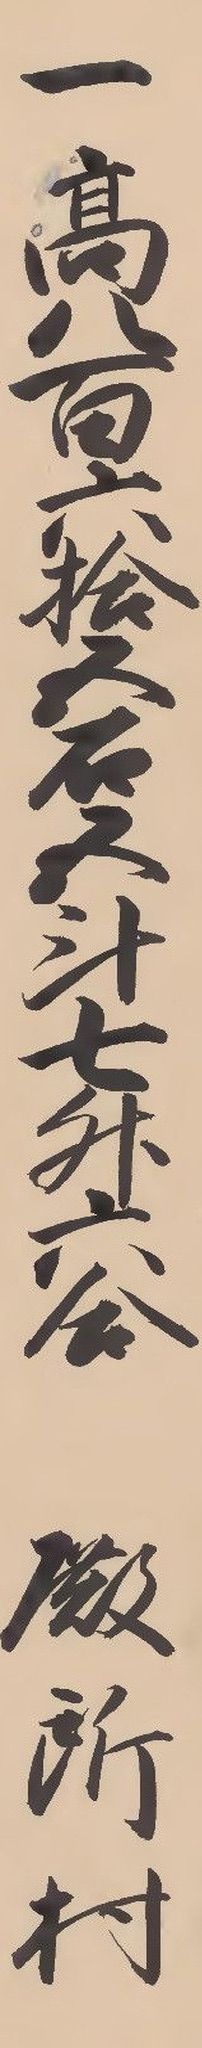一高八百六拾五石五斗七升六合殿所村
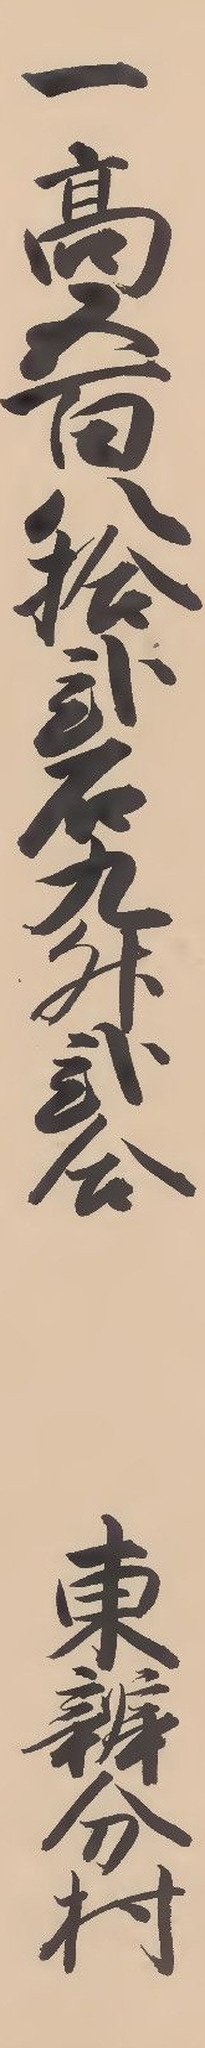一高五百八拾弐石九升弐合東弁分村
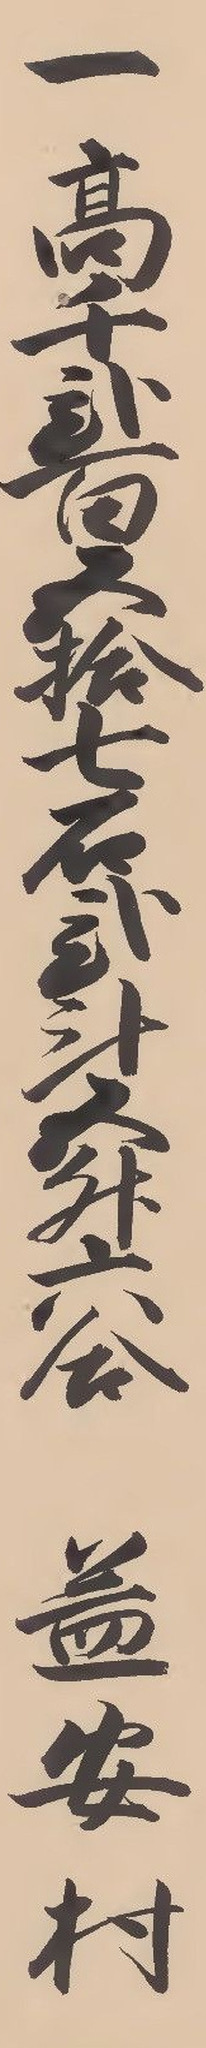一高千弐百五拾七石弐斗五升六合益安村
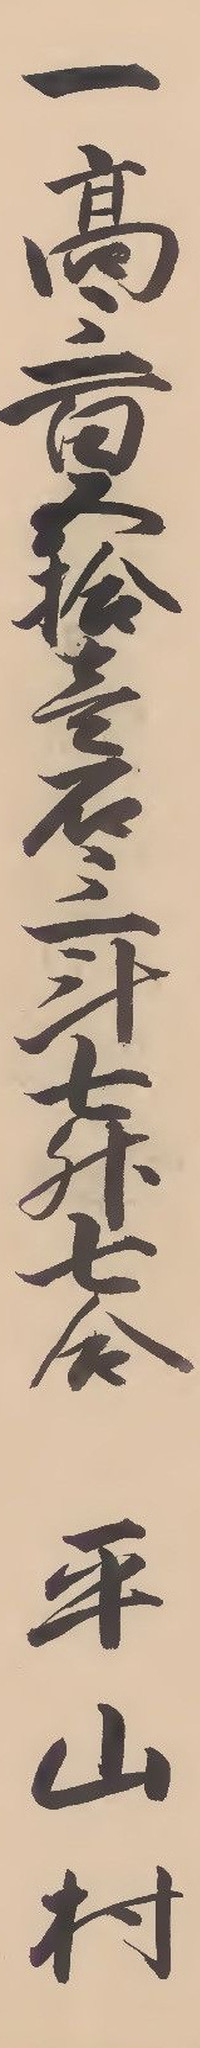一高三百五拾壱石三斗七升七合平山村

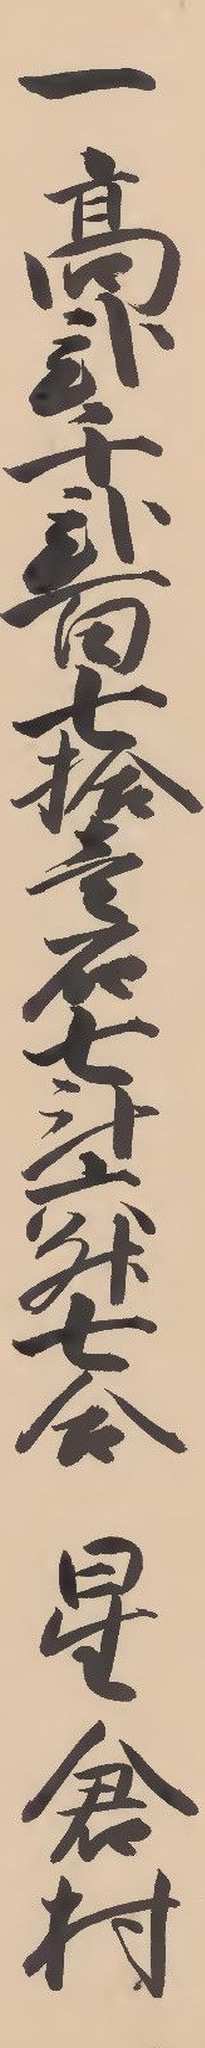一高弐千弐百七拾壱石七斗六升七合星倉村
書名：日向国郷帳
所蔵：国立公文書館 National Archives of Japan
